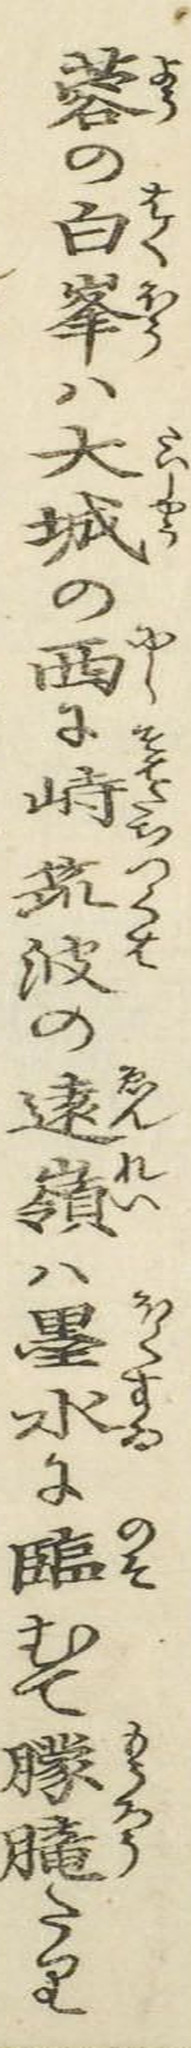蓉の白峯は大城の西に峙筑波の遠嶺は墨水に臨むて朦朧たり
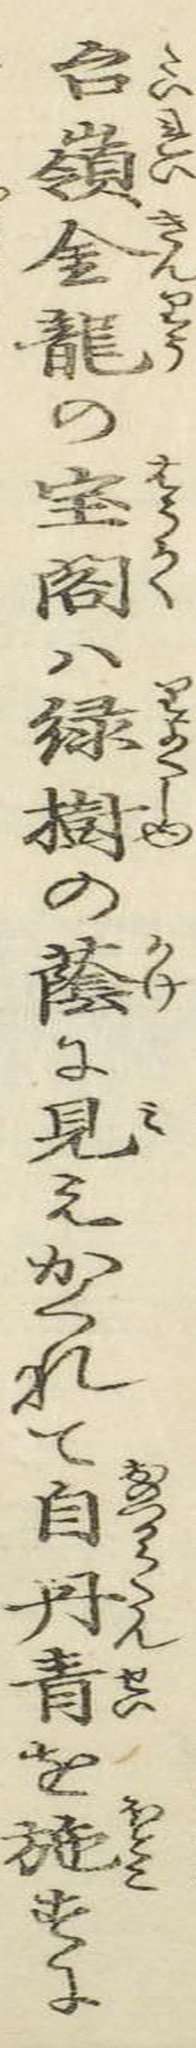台嶺金龍の宝閣は緑樹の蔭に見えかくれて自丹青を施すに
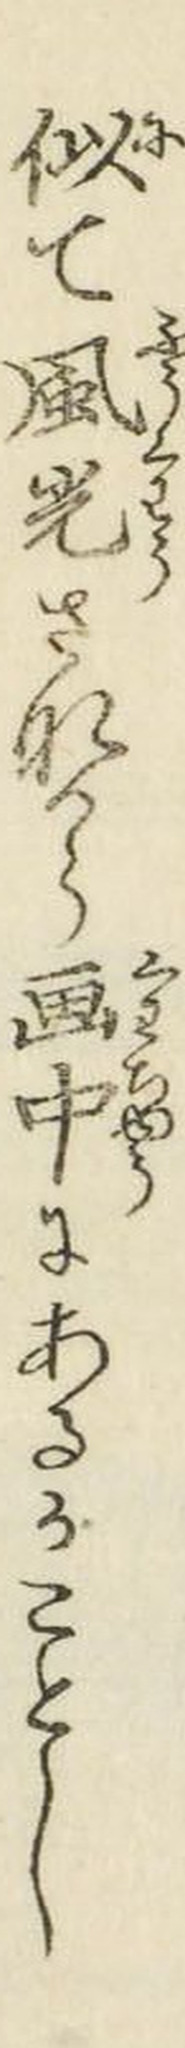似て風光さなから画中にあるかことし
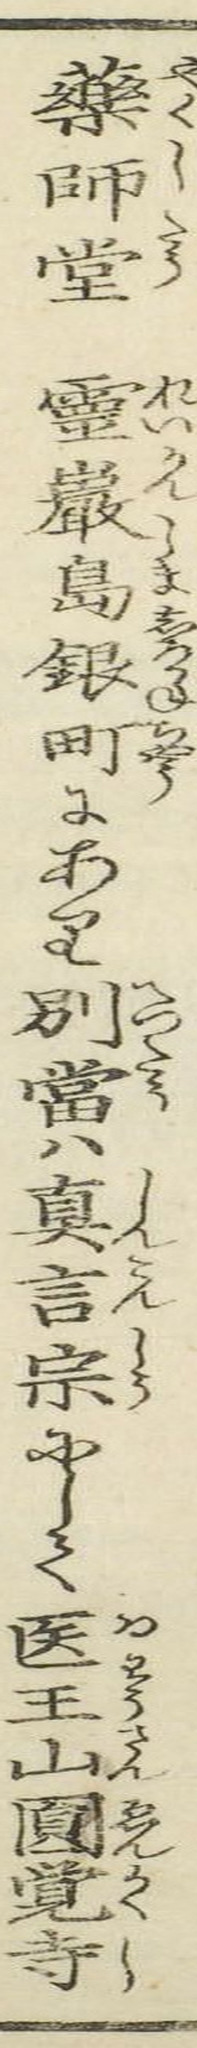薬師堂霊巖島銀町にあり別當は真言宗にして医王山圓覚寺
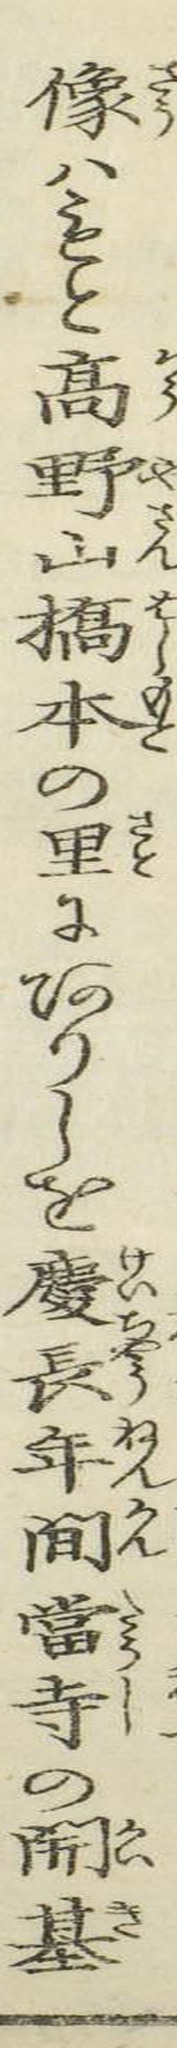像はもと高野山橋本の里にありしを慶長年間當寺の開基
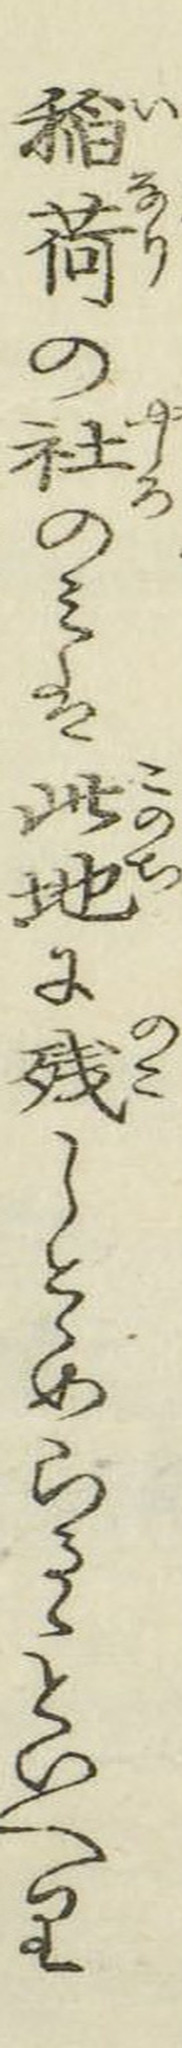稲荷の社のみは此地に残しとゝめらるゝといへり
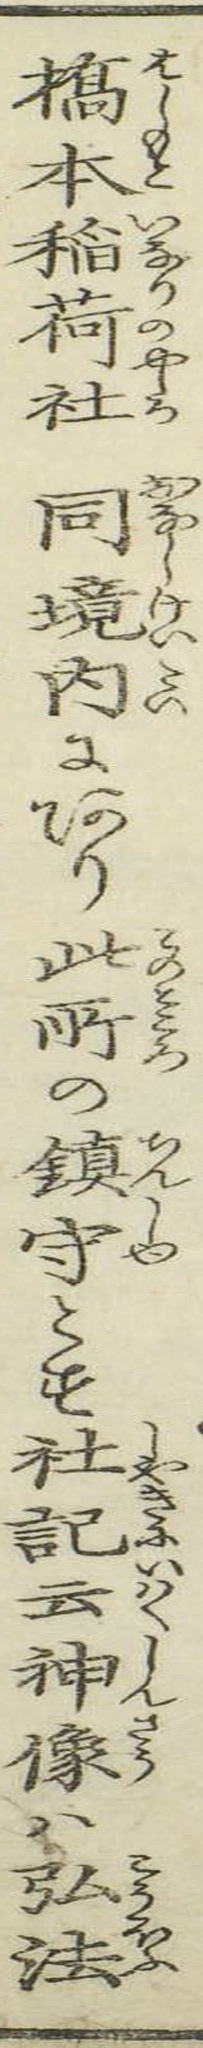橋本稲荷社同境内にあり此所の鎮守とす社記云神像は弘法
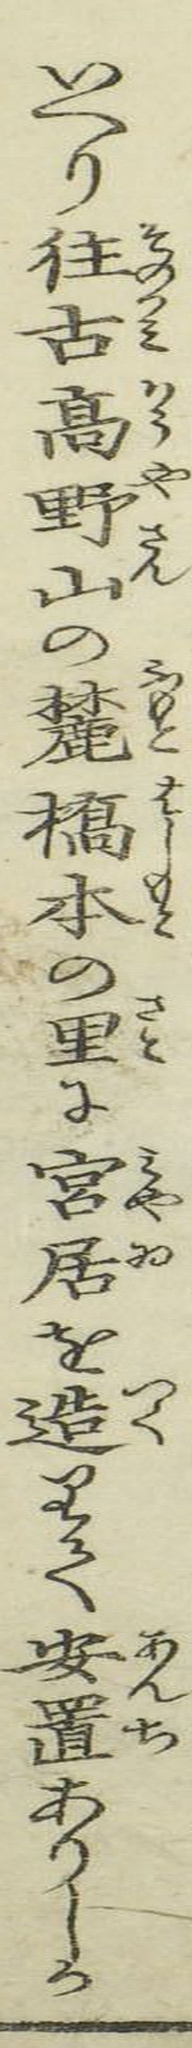いへり往古高野山の麓橋本の里に宮居を造りて安置ありしか

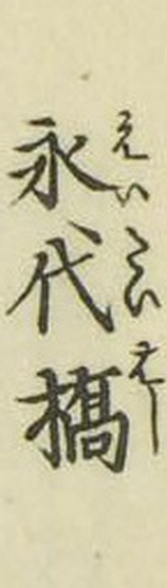永代橋
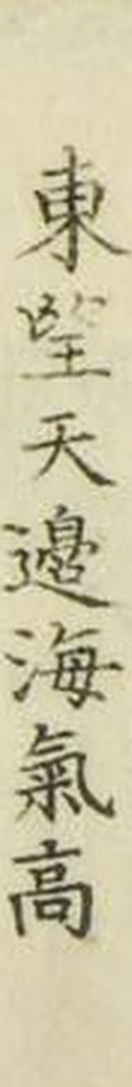東望天邊海氣高
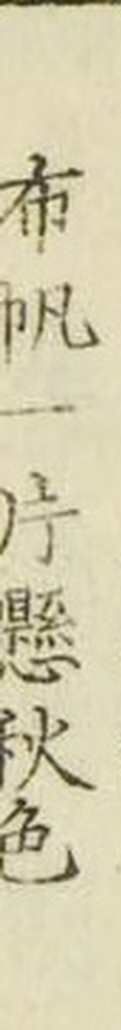布帆一片懸秋色
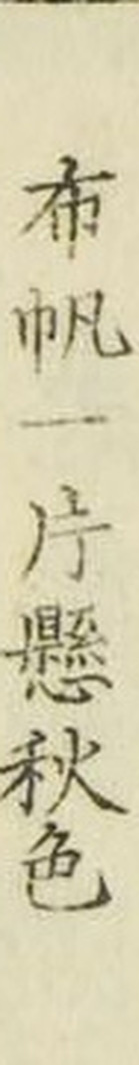布帆一片懸秋色
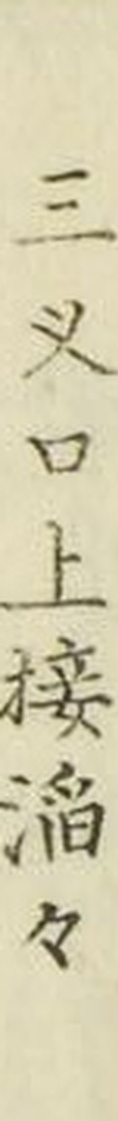三又口上接滔々
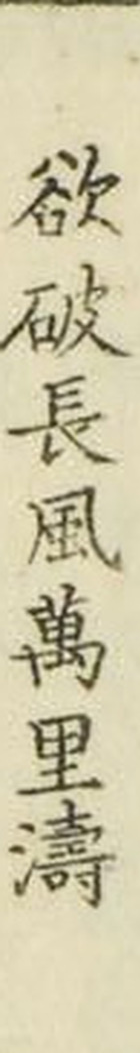欲破長風萬里涛

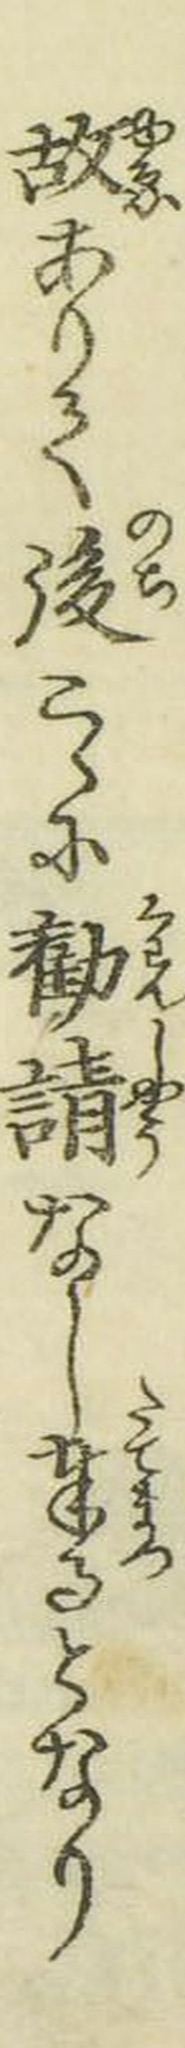故ありて後こゝに勧請なし奉るとなり
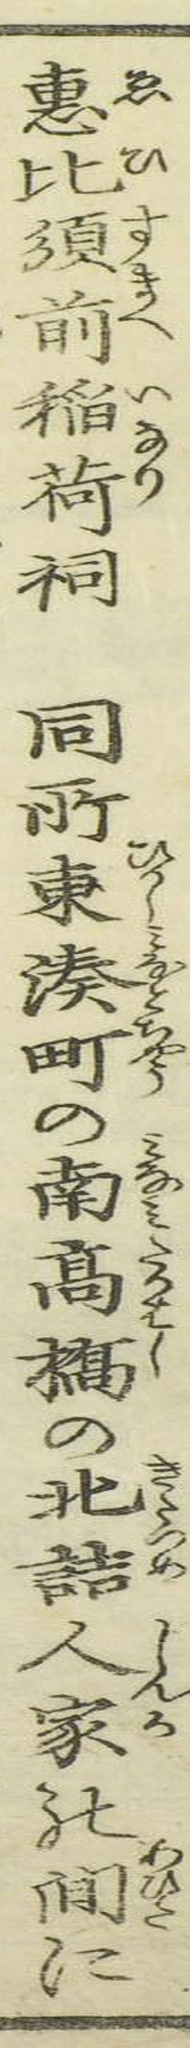恵比須前稲荷祠同所東湊町の南高橋の北詰人家の間に
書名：江戸名所図会 20巻 巻之2
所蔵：東京学芸大学教育コンテンツアーカイブ
